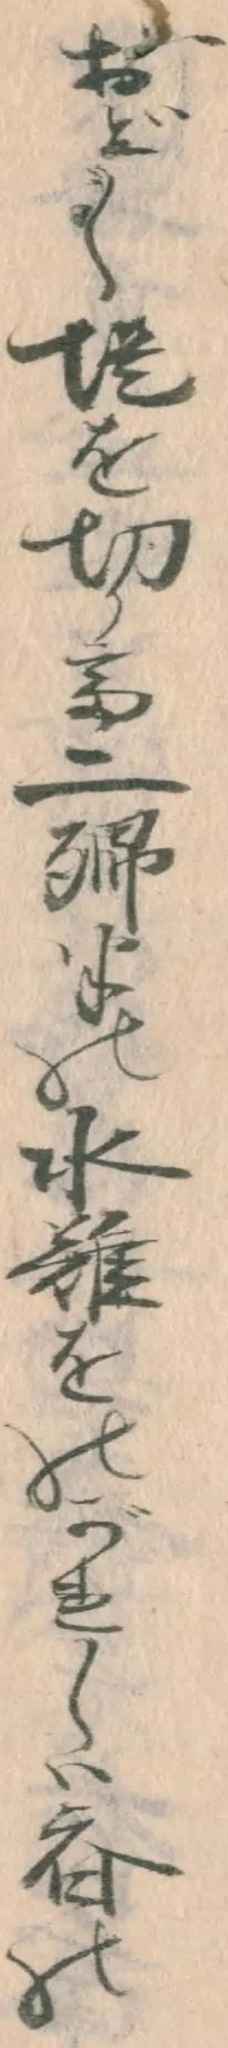おどし堤を切りて二郷半の水難をのがれしは斉の
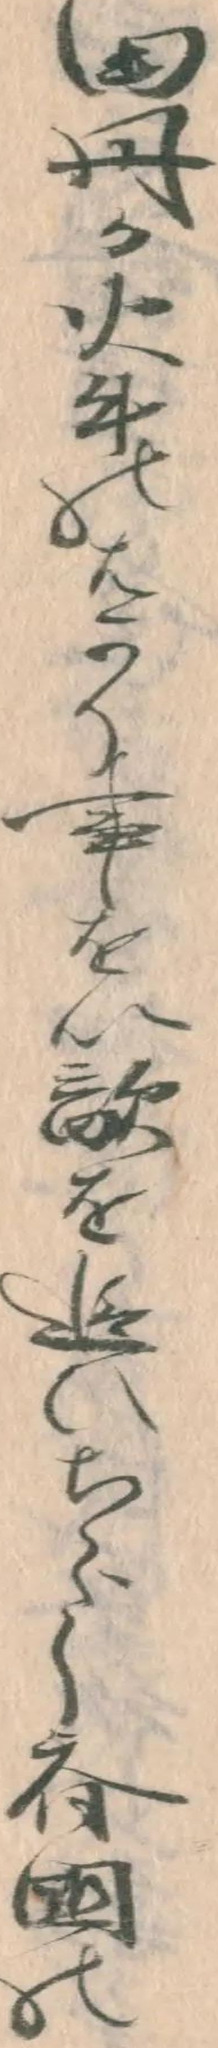田丹か火牛のはかり事を以敵を追ひらし斉国の
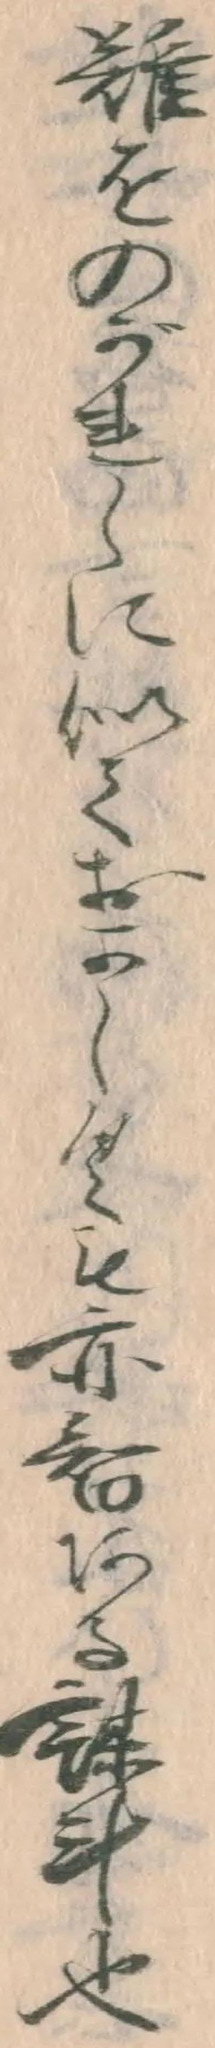難をのがれしに似ておかしくも亦智ある謀計也
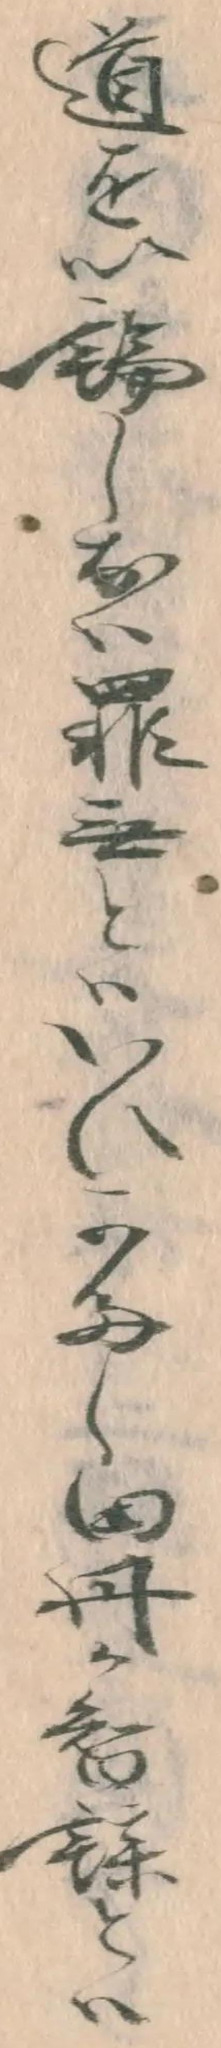道を以論しなは罪無とはいひかたし田丹か智余とは
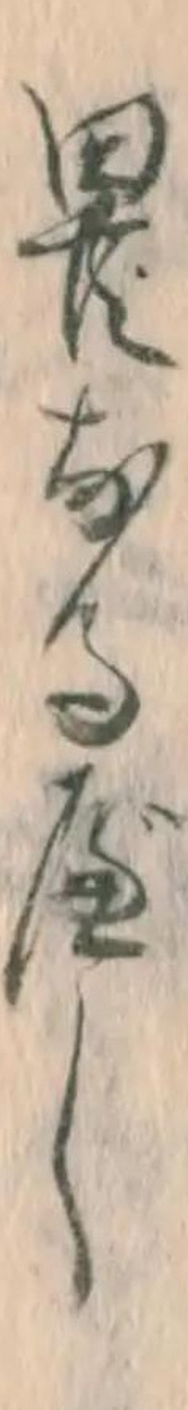異なるべし
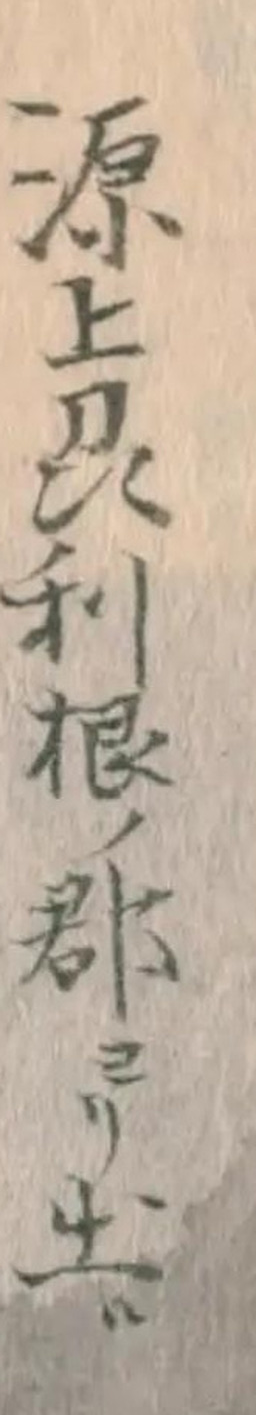源上州利根ノ郡ヨリ出ル
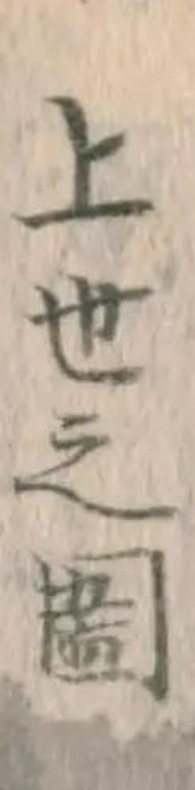上世之図
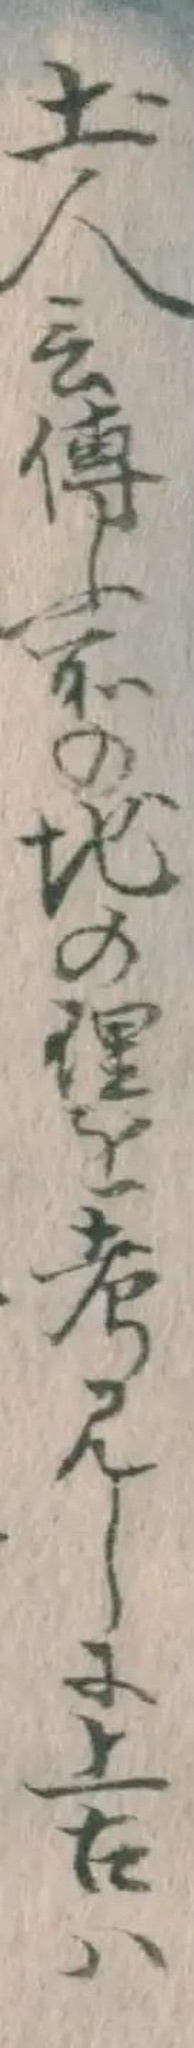土人言伝ふ所の地の理を考見しに上古は
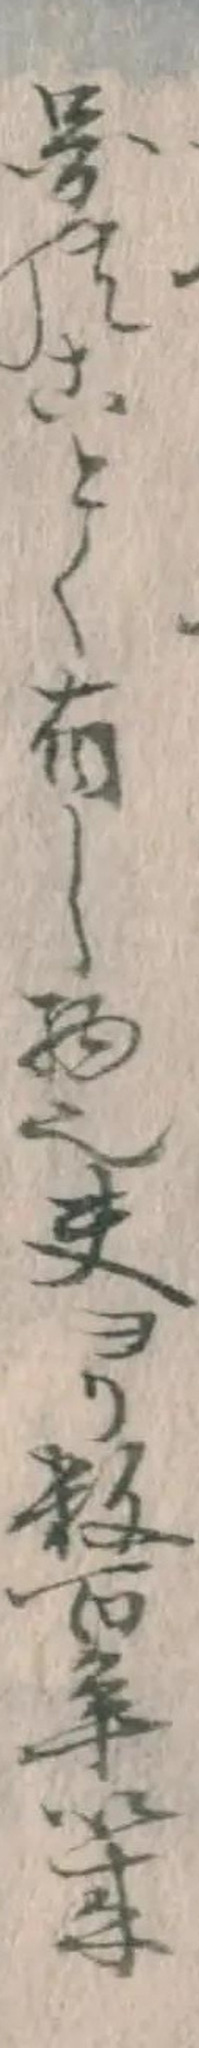図のことく有し物也夫より数百年以来
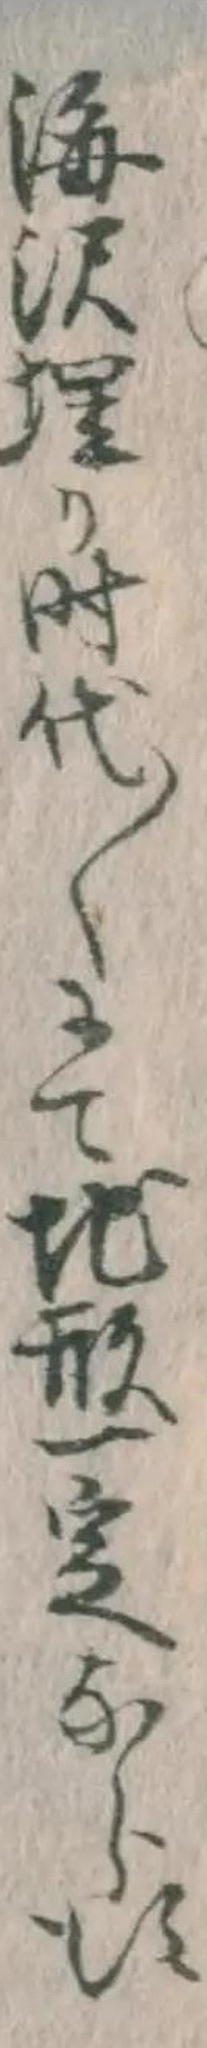海沢埋り時代〳〵にて地形一定ならす
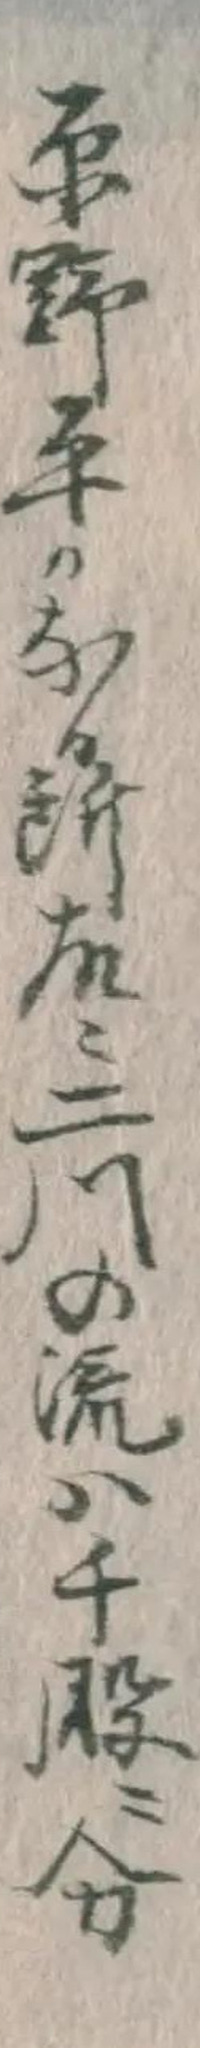原野平かなる所故に川の流は千股に分
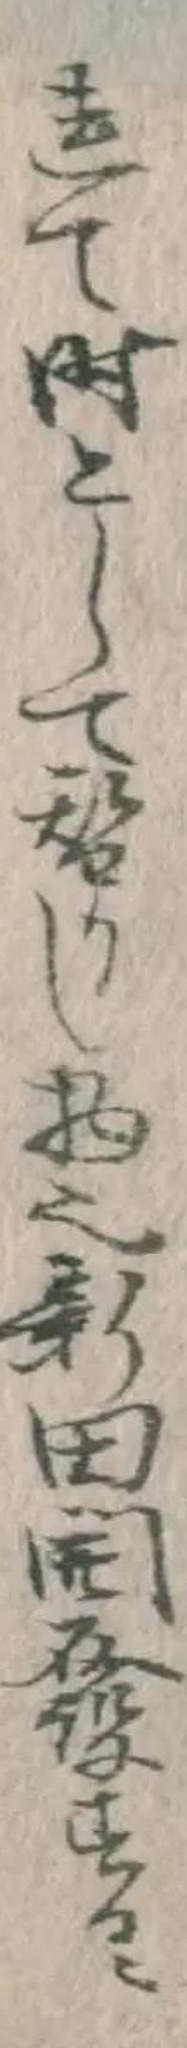れて時として替りし物也新田開発するに
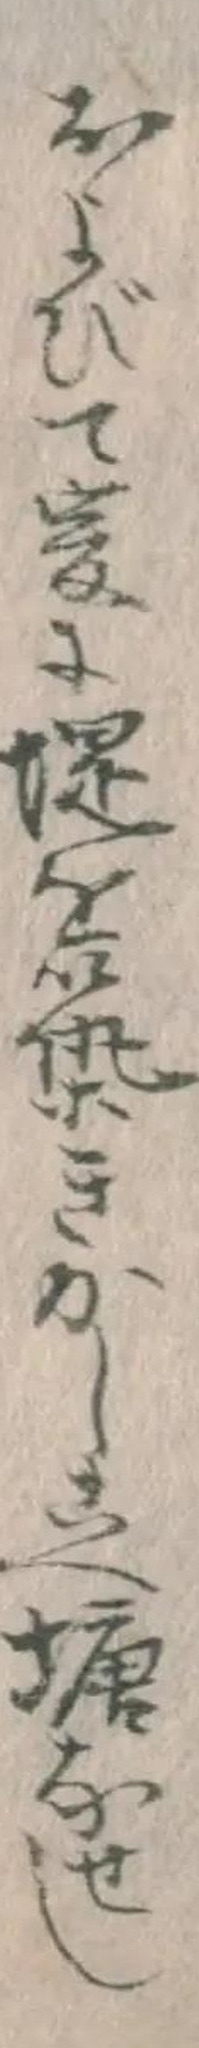およびて爰に堤を築きかしこへ塘なせし
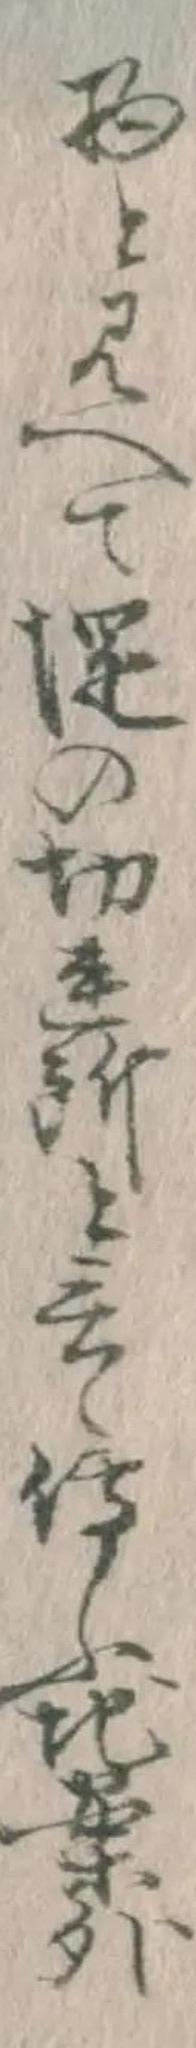物と見へて堤の切れ所と言ゝ伝ふ地案外
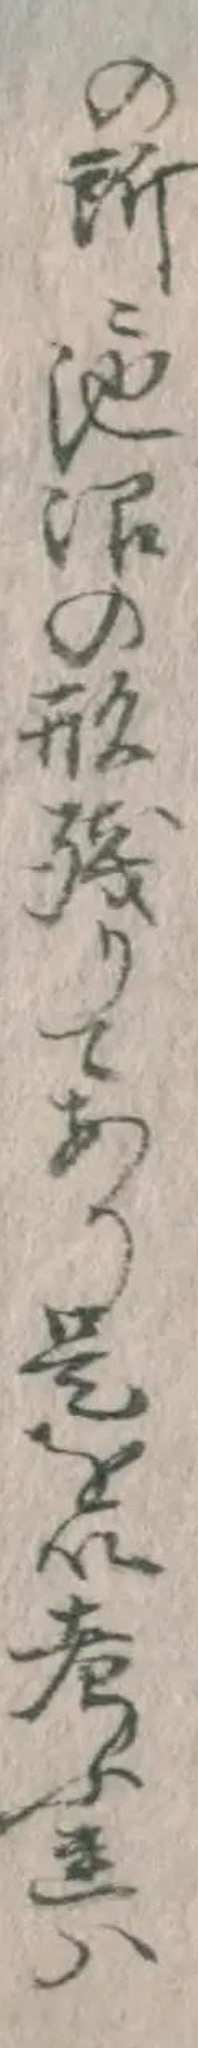の所に池沼の形残りてあり是を以考ふれは
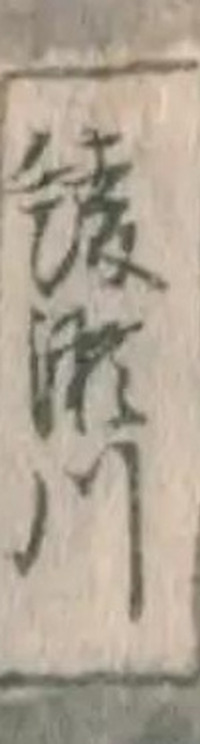綾瀬川
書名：四神地名録 6巻. [4]葛飾郡
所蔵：国立国会図書館 National Diet Library, JAPAN
